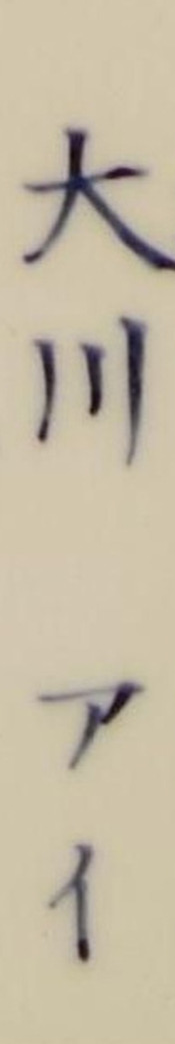大川アイ
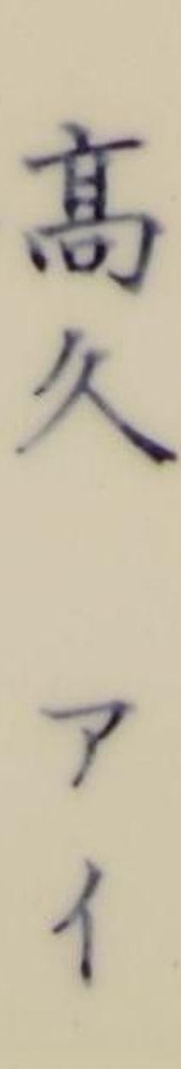高久アイ
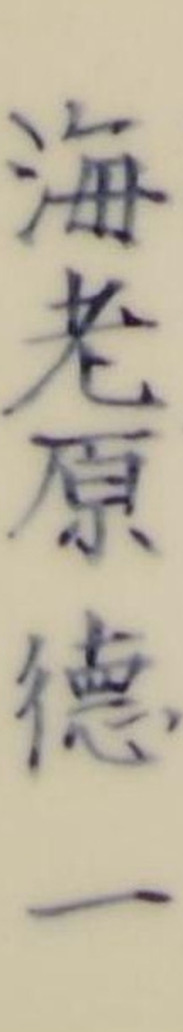海老原徳一
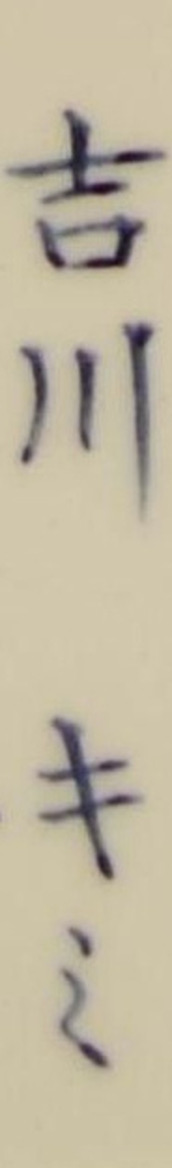吉川キミ
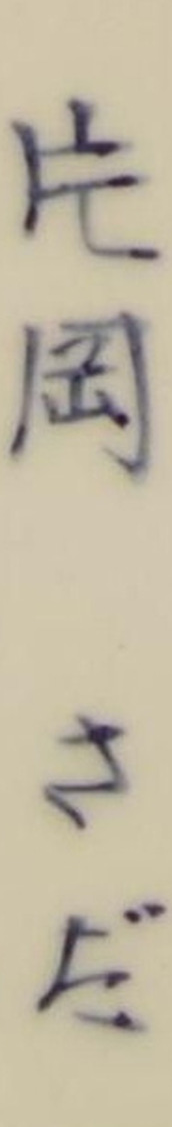片岡さだ
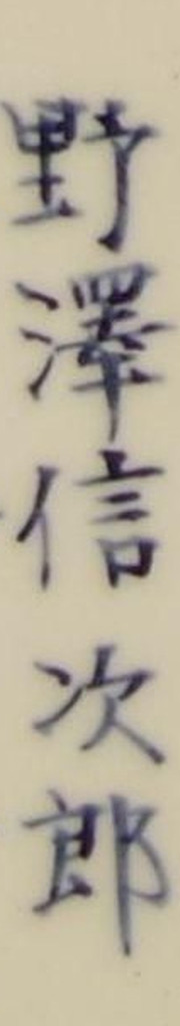野澤信次郎
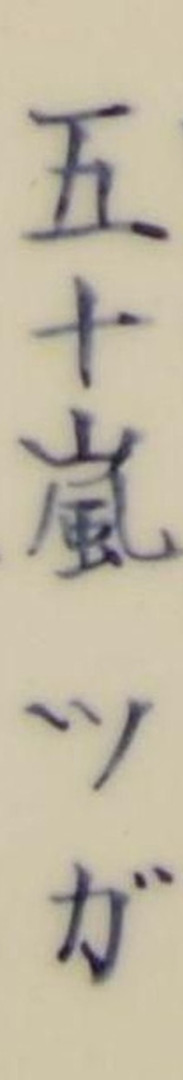五十嵐ツガ
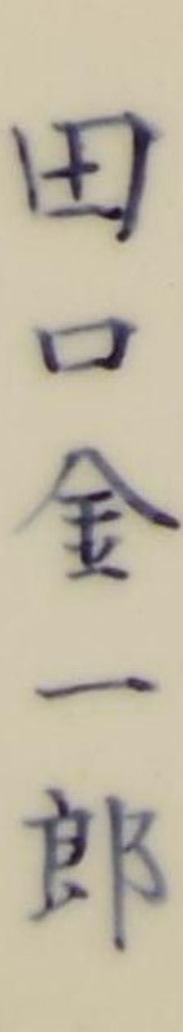田口金一郎
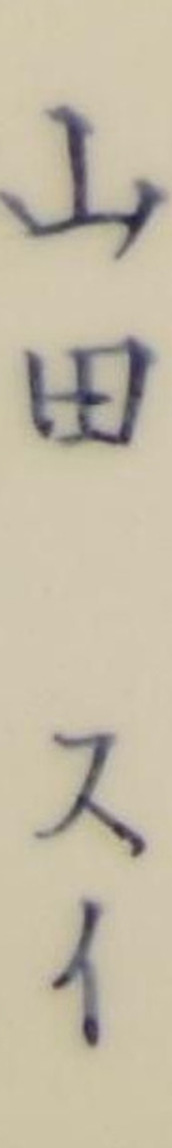山田スイ
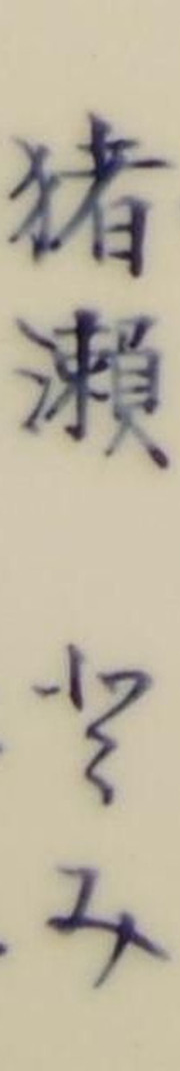猪瀬とみ
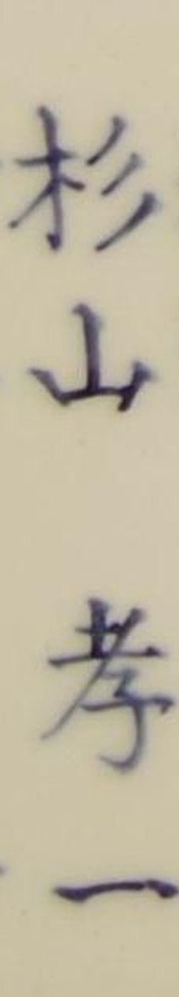杉山孝一
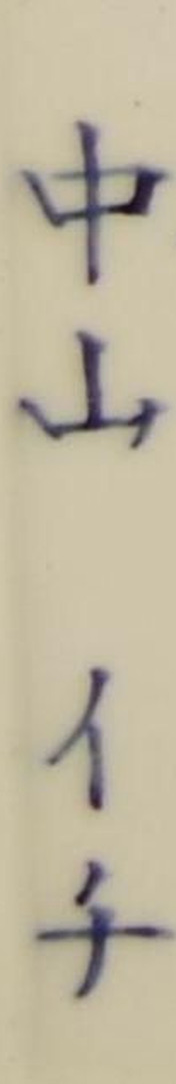中山イチ

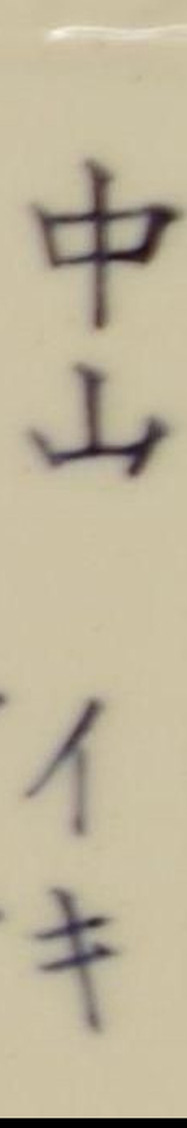中山イキ
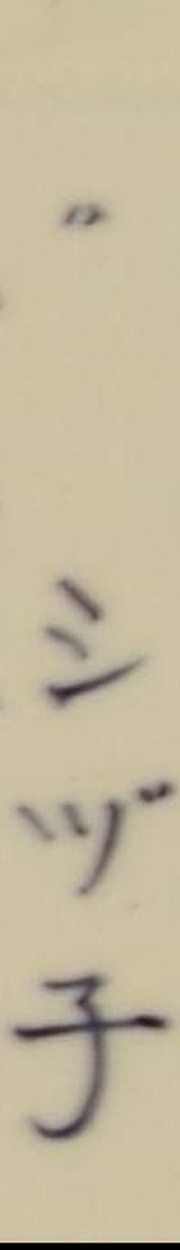シヅ子
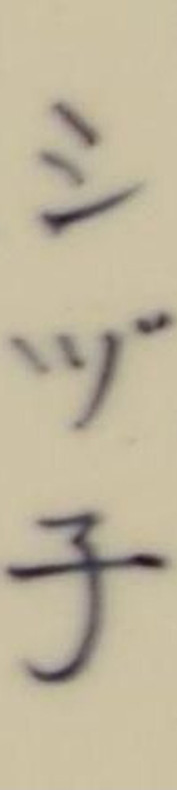シヅ子
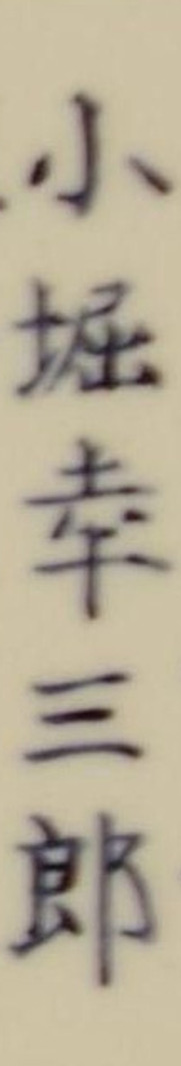小堀幸三郎
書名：E~L
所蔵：高野山金剛峯寺
